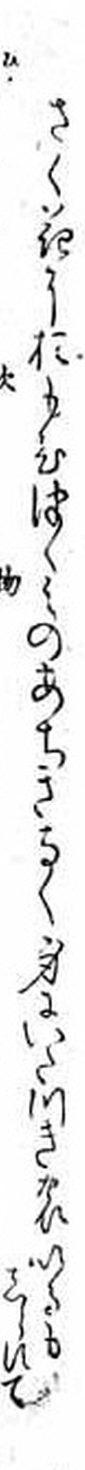さく花におもひつくみのあちきなく身にいたつきのいるもしらすて
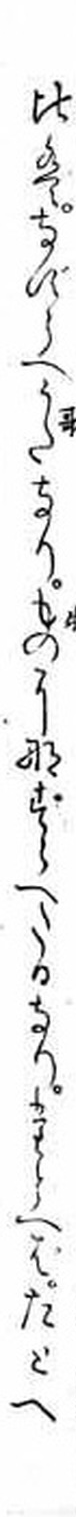比は。なずらへうたなり。ものになずらへたるなり。たとへば。たとへ
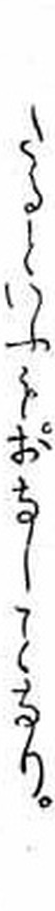たるといふも。おなしことなり。
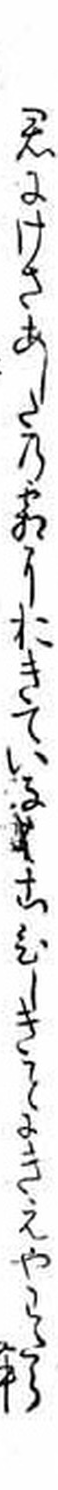君にけさあしたの霜におきていなばこひしきことにきえやわたらむ
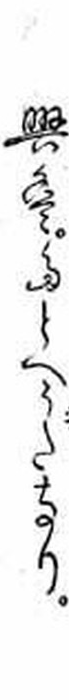興は。たとへうたなり。
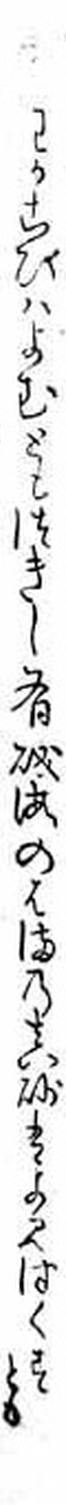わかこひはよむともつきし有磯海のはまの真砂はよみつくすとも
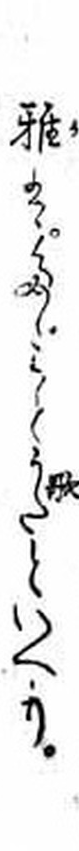雅は。たゞことうたといへり。
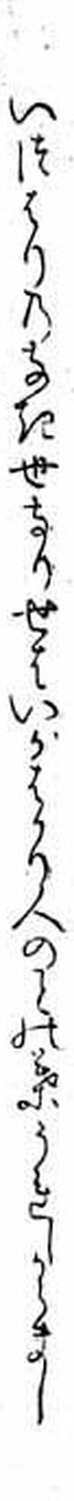いつはりのなき世なりせはいかはかり人のことの葉うれしからまし
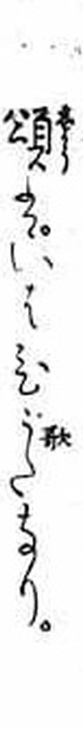頌は。いはひうたなり。
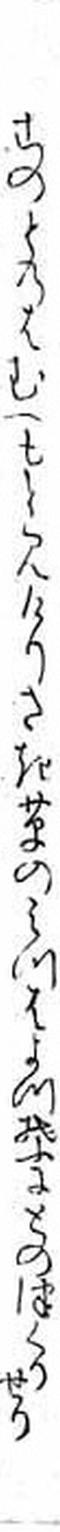このとのはむへもとみけりさき草のみつはよつ葉にとのつくりせり
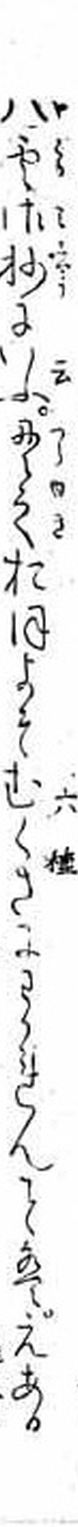八雲御抄にいふ。貫之おほよそむくさにわかれんことは。えある
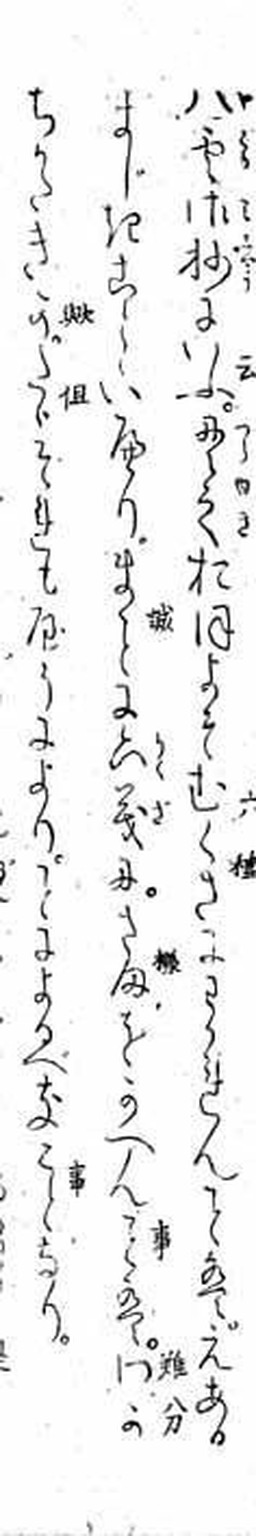まじきことゝいへり。まことに六義に。さまをかへんことは。わか
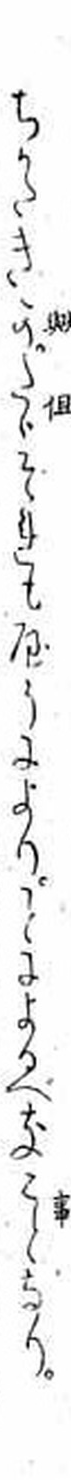ちかたきか。たゞそれもやうにより。ことによるべきことなり。
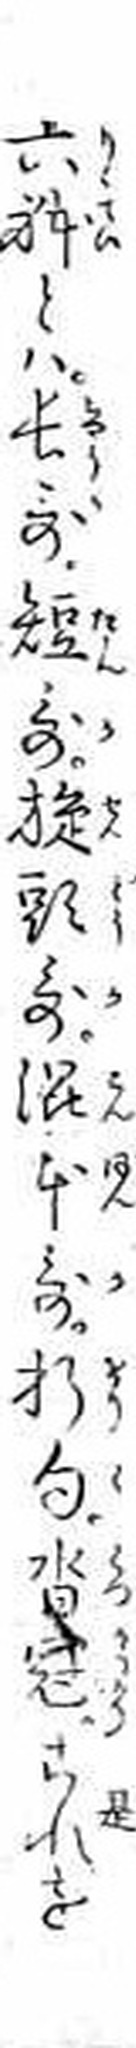六体とは。長哥。短哥。旋頭哥。混本哥。折句。沓冠。これを
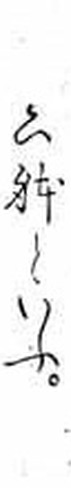六体といふ。
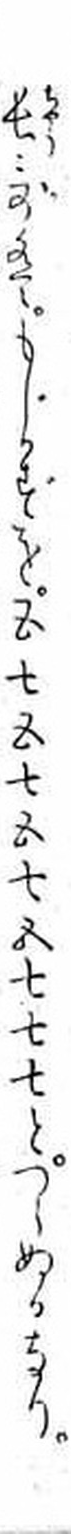長哥は。もじかずを。五七五七五七五七七七と。つらぬるなり。
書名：女学範
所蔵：東京学芸大学教育コンテンツアーカイブ
